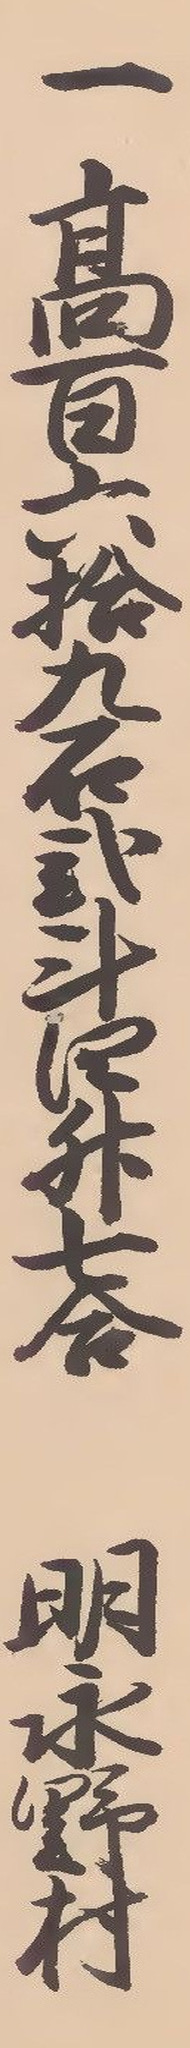一高百六拾九石弐斗升四升七合明永野村
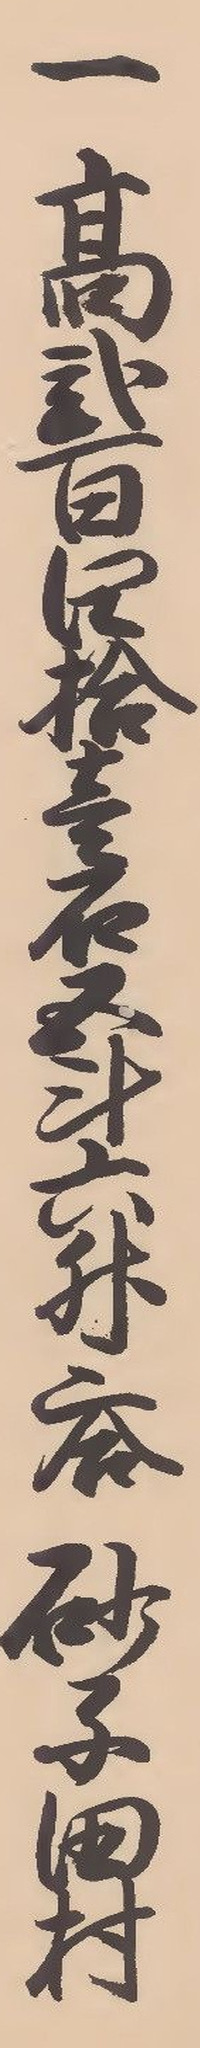一高弐百四拾壱石五斗六升三合砂子田村
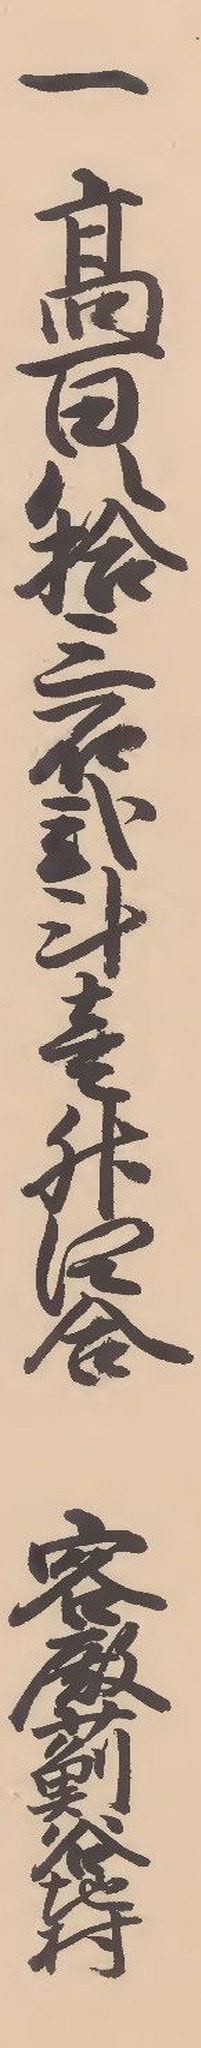一高百八拾三石弐斗壱升四合客殿薊谷地村
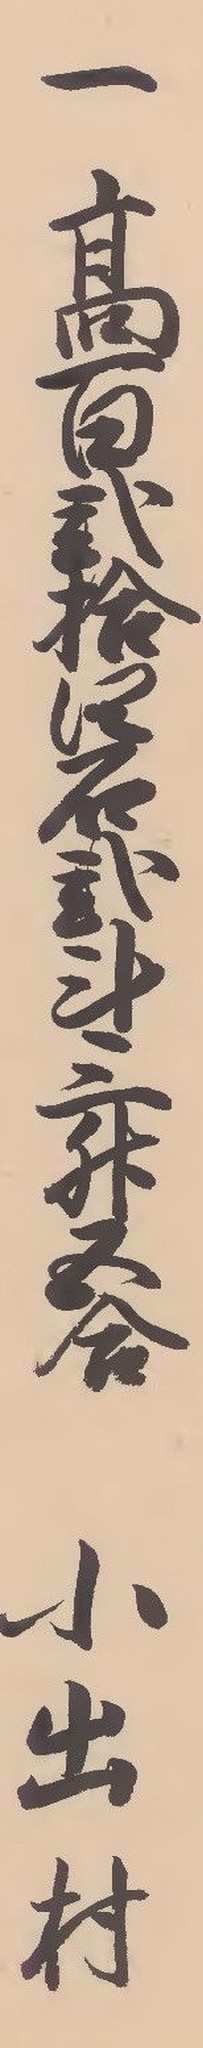一高百弐拾四石弐斗三升五合小出村
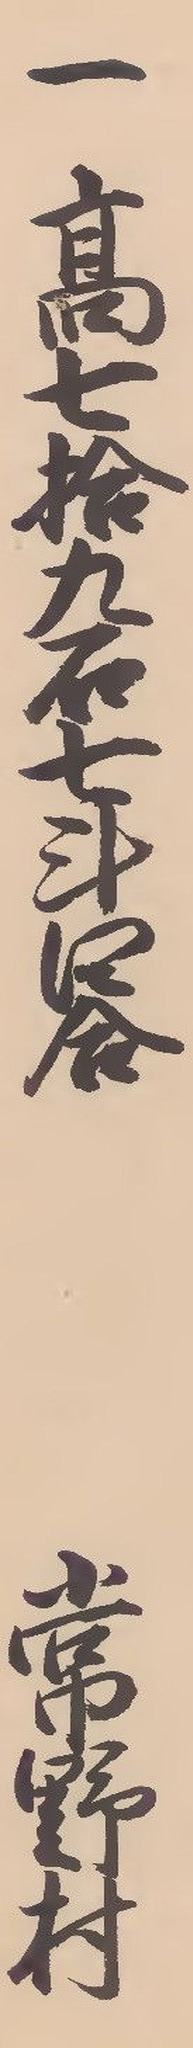一高七拾九石七斗四合常野村

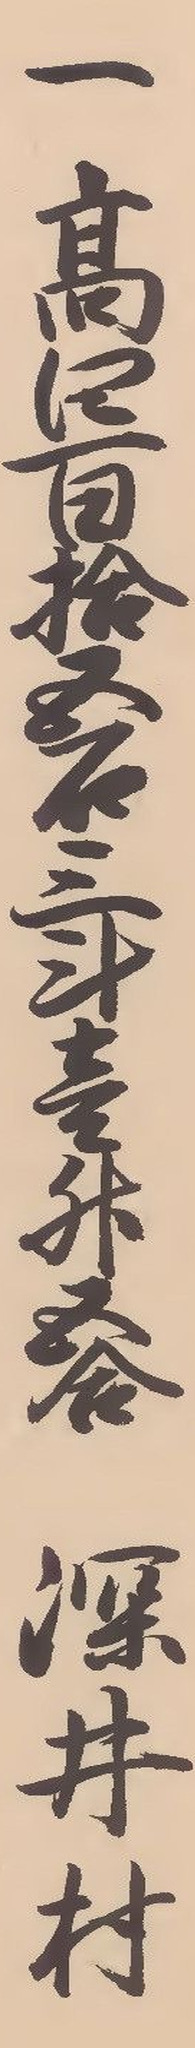一高四百拾五石三斗壱升五合深井村
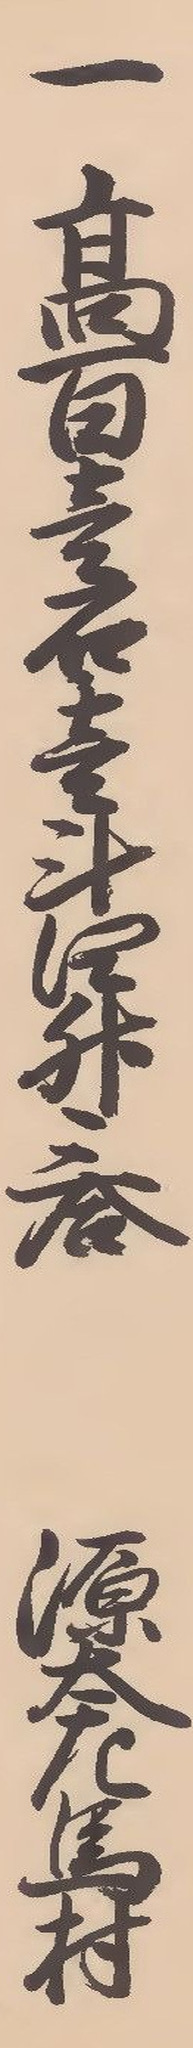一高百壱石壱斗四升三合源太左馬村
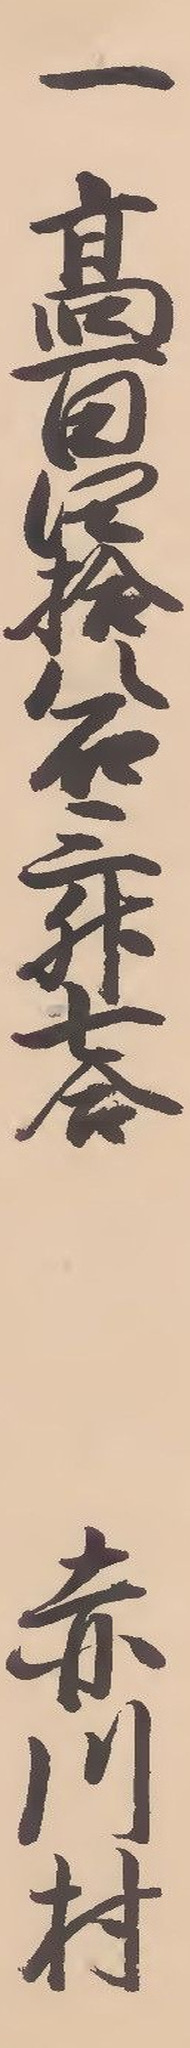一高百四拾八石三升七合赤川村
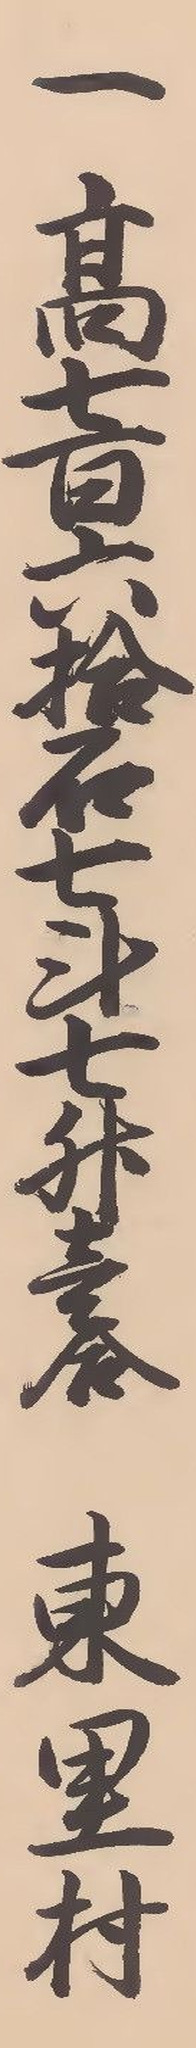一高七百六拾石七斗七升壱合東里村
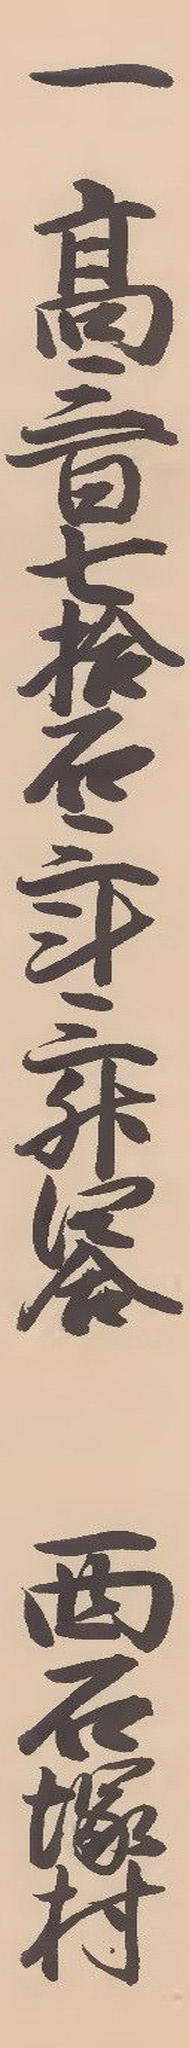一高三百七拾石三斗三升四合西石塚村
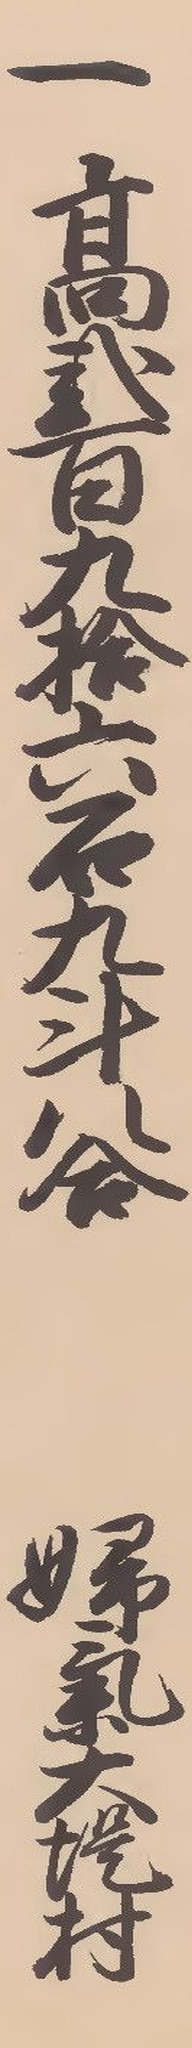一高弐百九拾六石九斗八合婦気大堤村
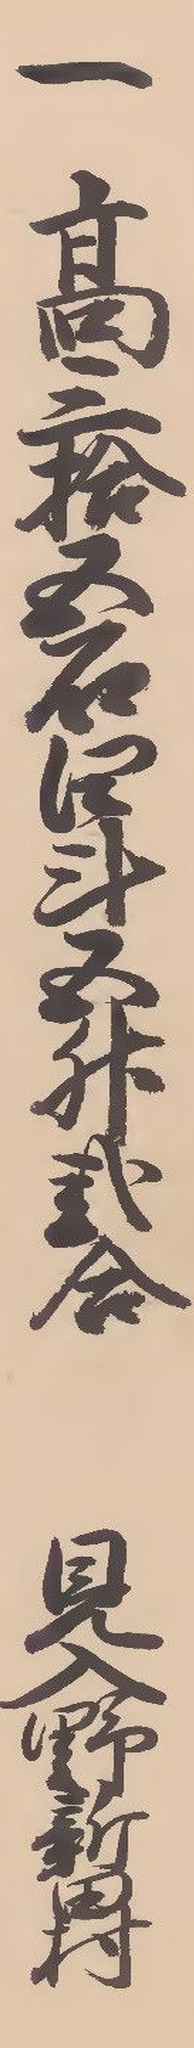一高三拾五石四斗五升弐合見入野新田村

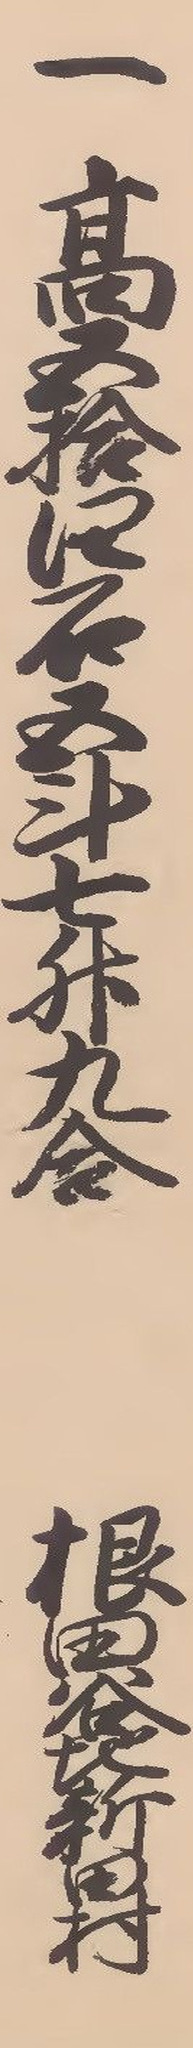一高五拾四石五斗七升九合根田谷地新田村
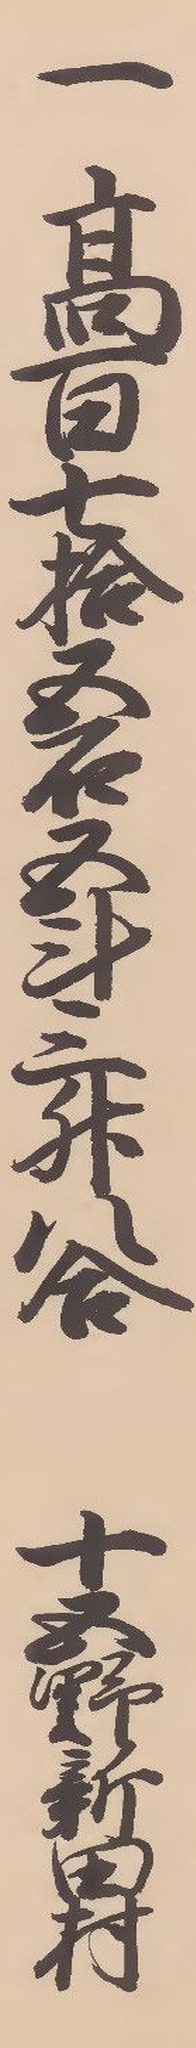一高百七拾五石五斗三升八合十五野新田村
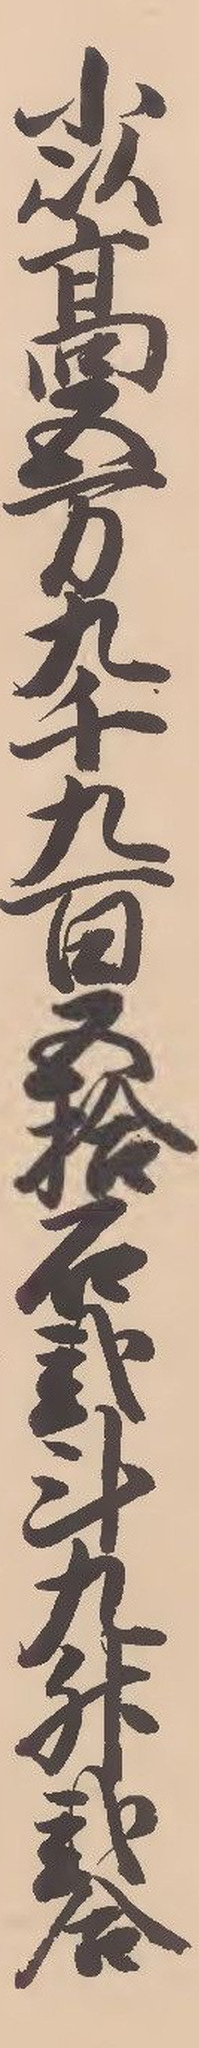小以高五万九千九百五拾石弐斗九升弐合
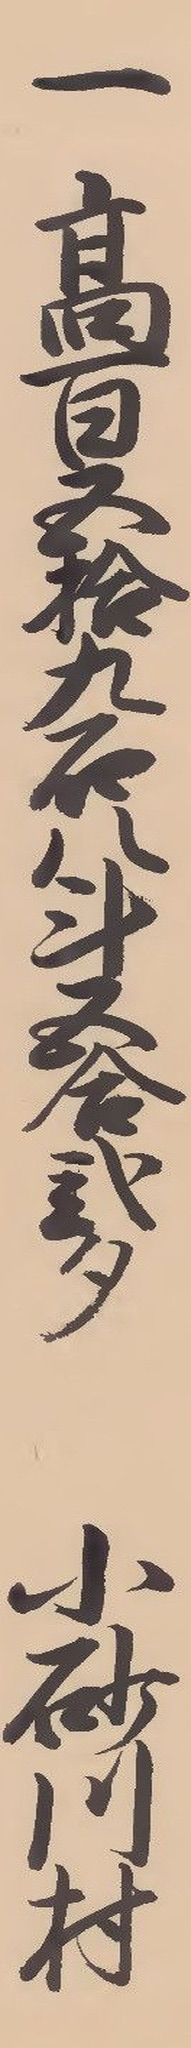一高百五拾九石八斗五合弐勺小砂川村
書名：出羽国郷帳　５
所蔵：国立公文書館 National Archives of Japan
